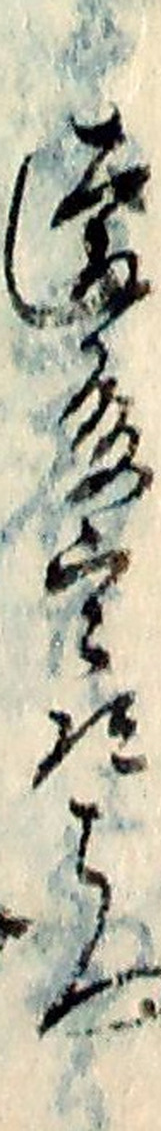遠藤宇次衛門
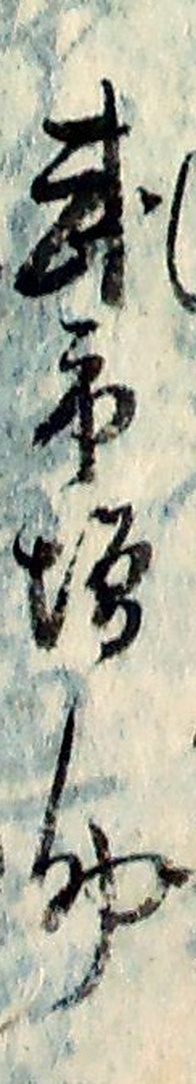武市増助
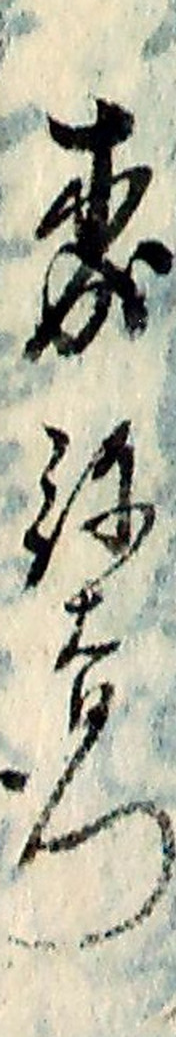森八左衛門
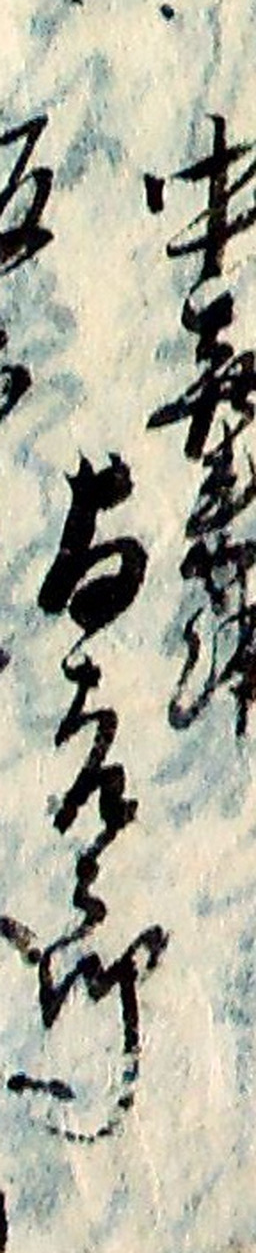与吉郎
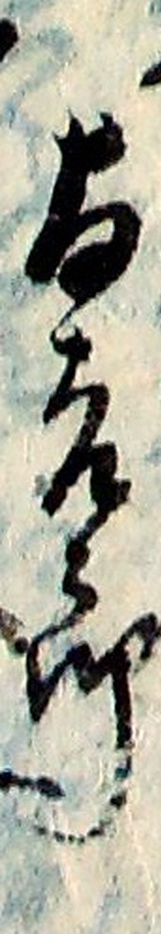与吉郎
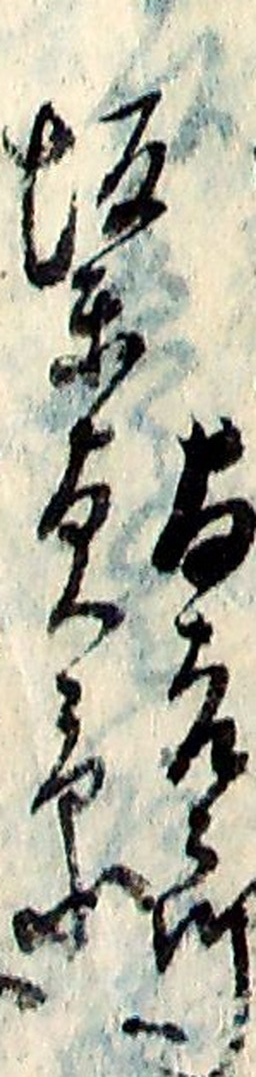坂東貞兵衛
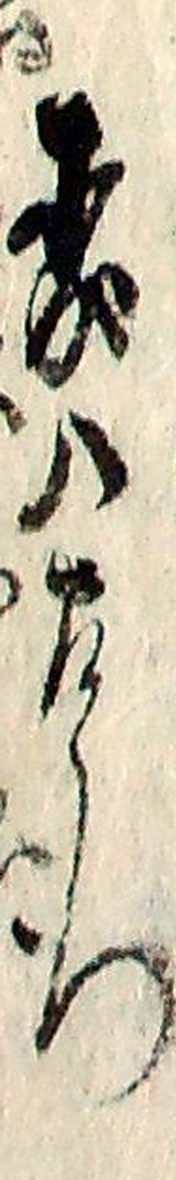森八左衛門

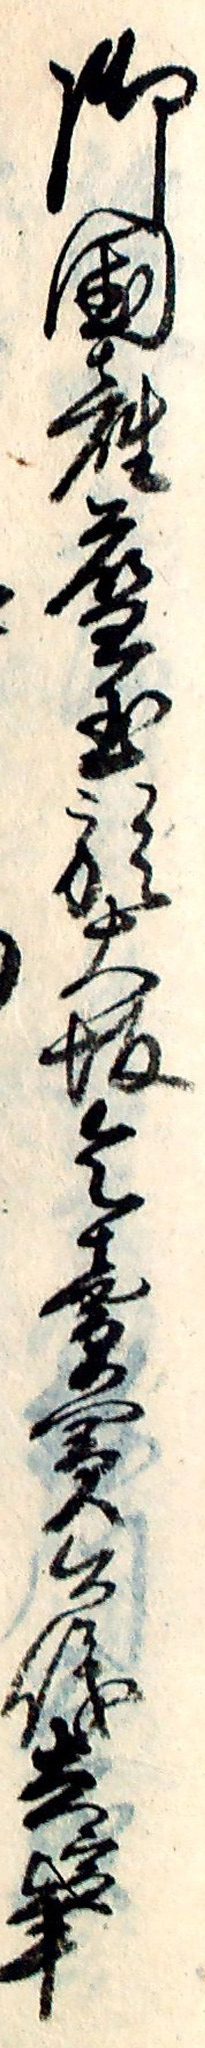御国産藍玉於大坂令売買候儀去寅年
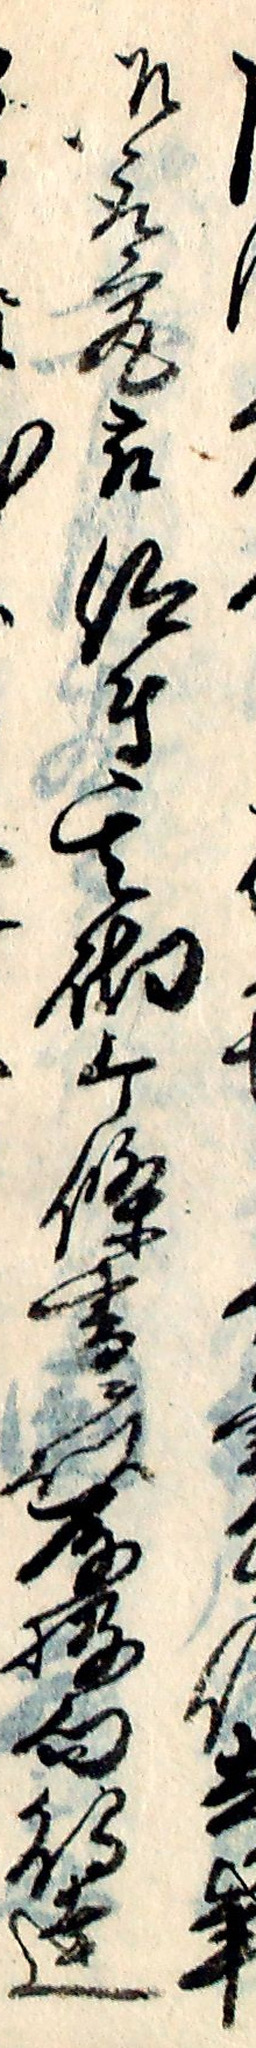御取究被仰付其砌ケ条書を以て取扱向触達
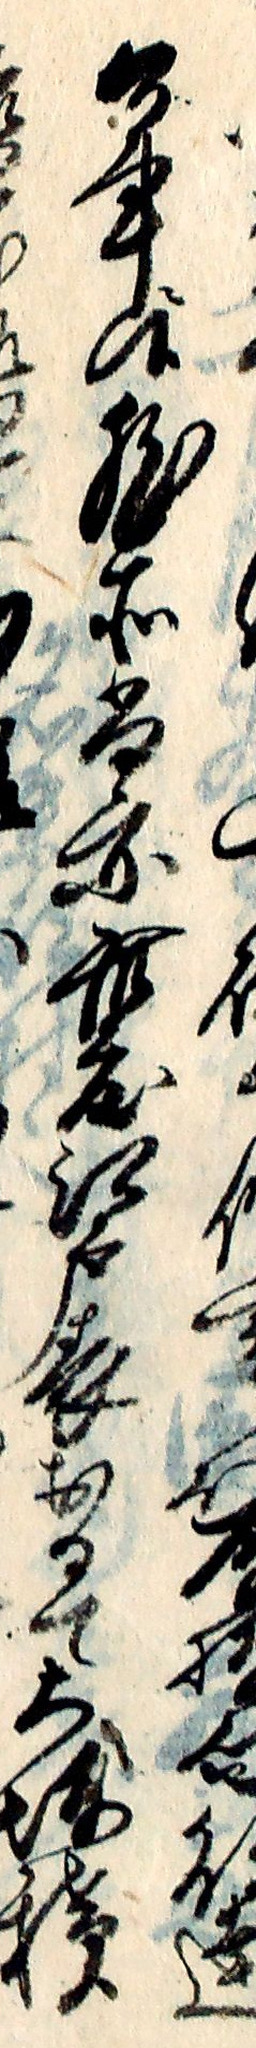候事に候然所尚亦此度江戸表おゐて大坂積
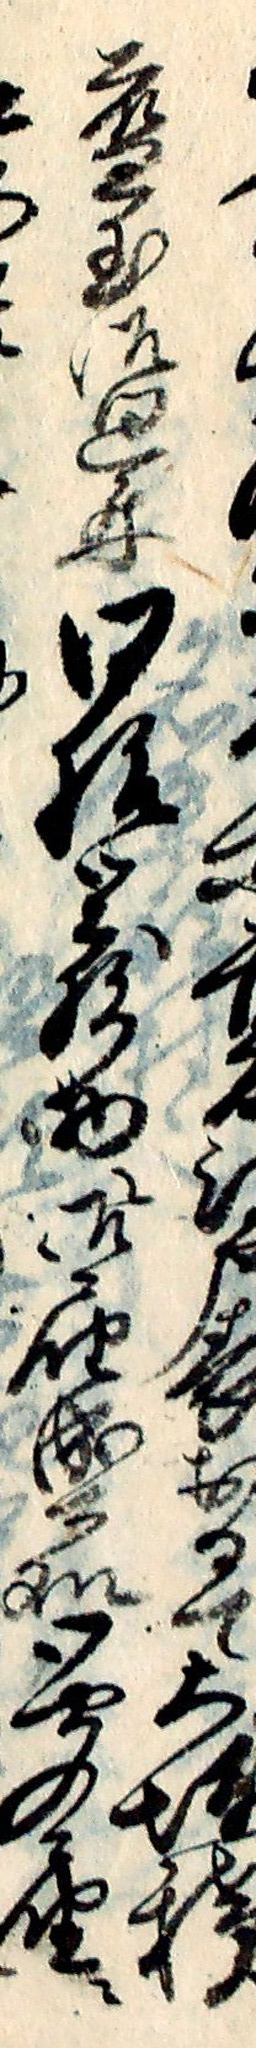藍玉御廻米同様御蔵物に御届成候処御聞届に
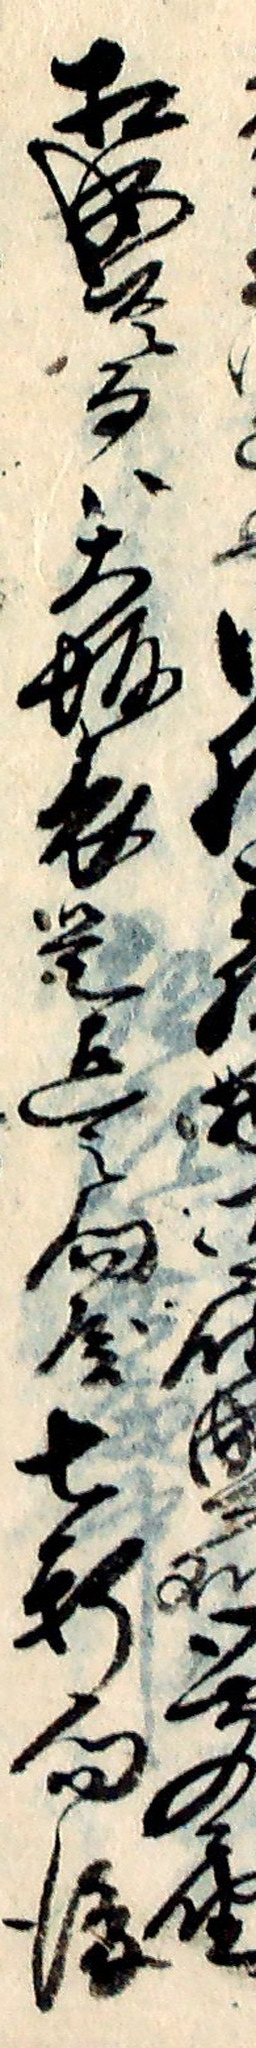相成候にては大坂表是迄之問屋七軒向後
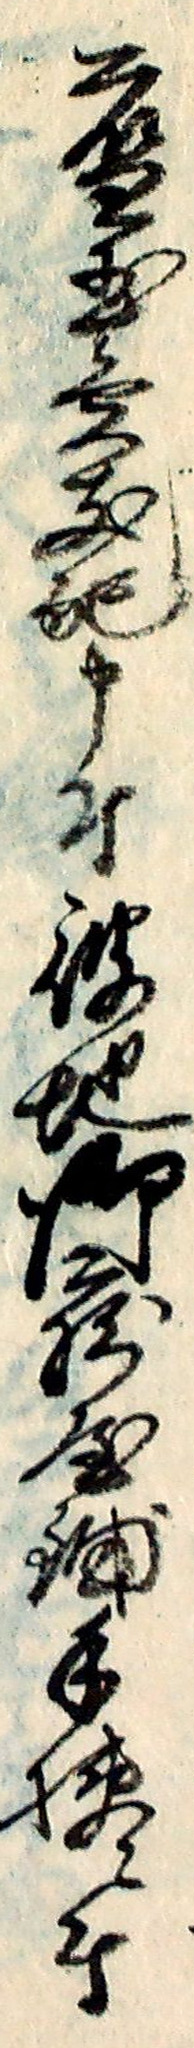藍玉売支配申付彼地御蔵屋舗手狭に付
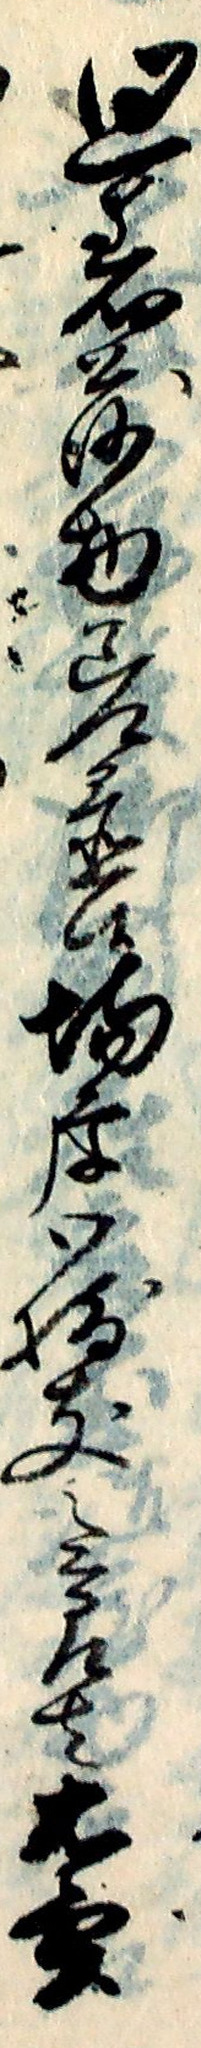廻着荷物差置候場処御指支之節は右売
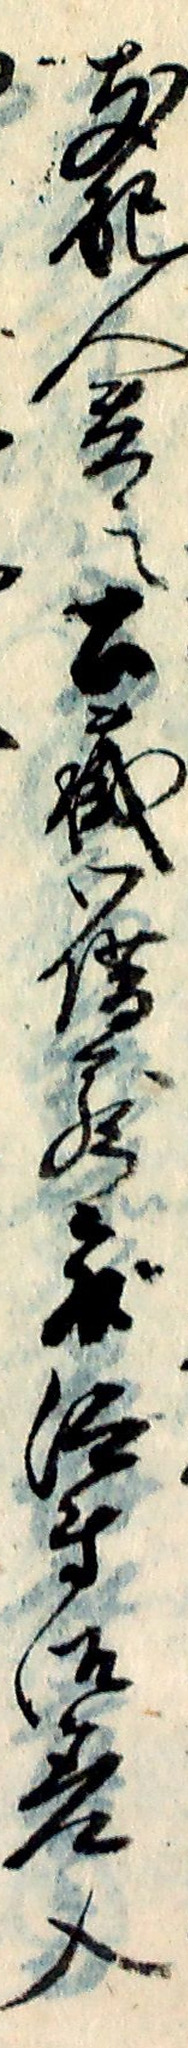支配人共之土蔵御借蔵被仰付御差入
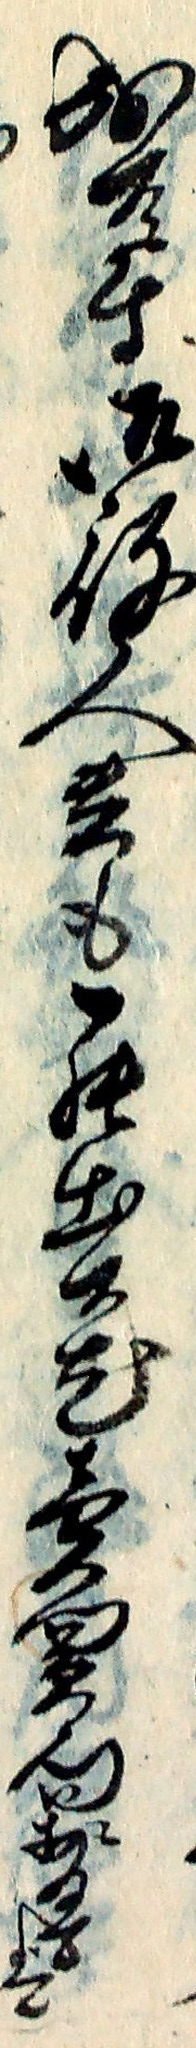成候に付御役人共も罷出候尤売買向におゐては
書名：諸御願書控(後藤氏壱番）
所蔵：鳴門教育大学 Naruto University of Education
